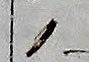1
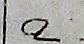2
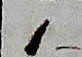1
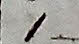1
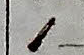1
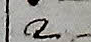2
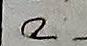2
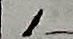1
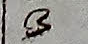3
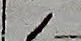1
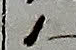1
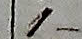1
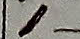1
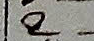2
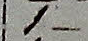1
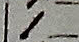1
